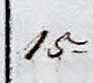15
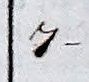7
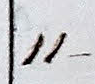11
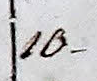10
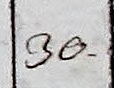30
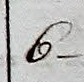6
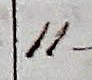11
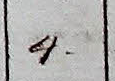4.
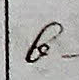6
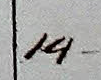14
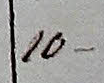10
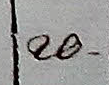20
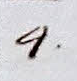4
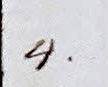4.
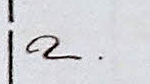2.
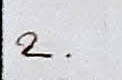2.
